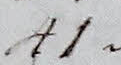41
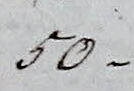50
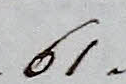61
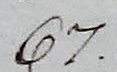67
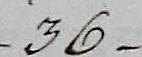36
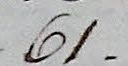61
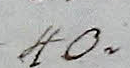40
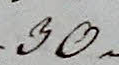30
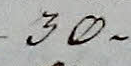30
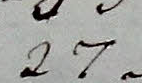27
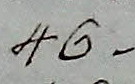46
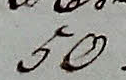50
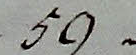59
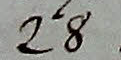28
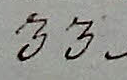33
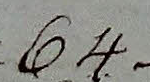64
